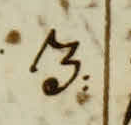3:
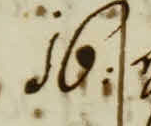16:
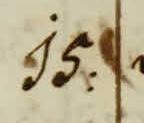15:
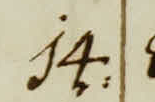14:
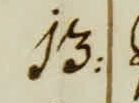13:
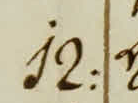12:
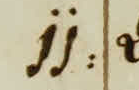11:
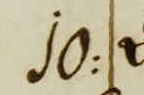10:
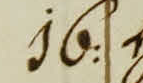16:
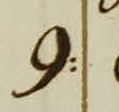9:
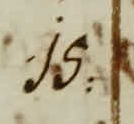15:
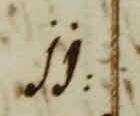11:
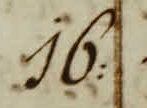16:
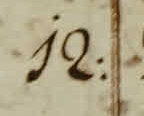12:
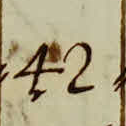42
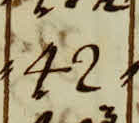42
